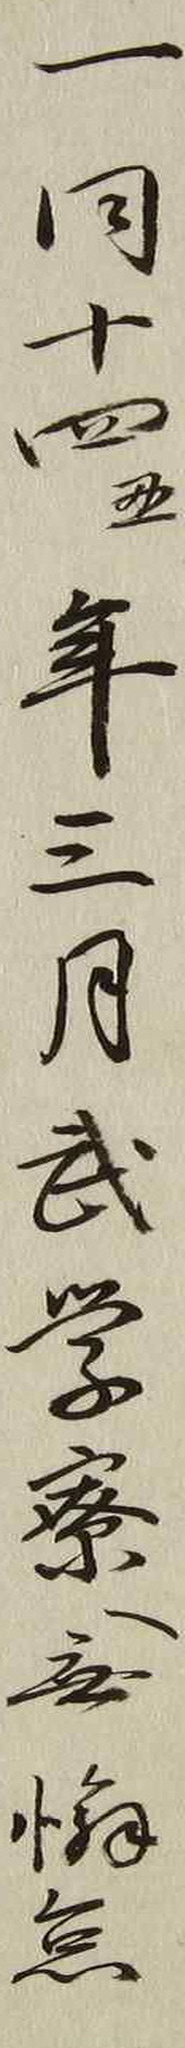一同十四丑年三月武学寮へ懈怠無く
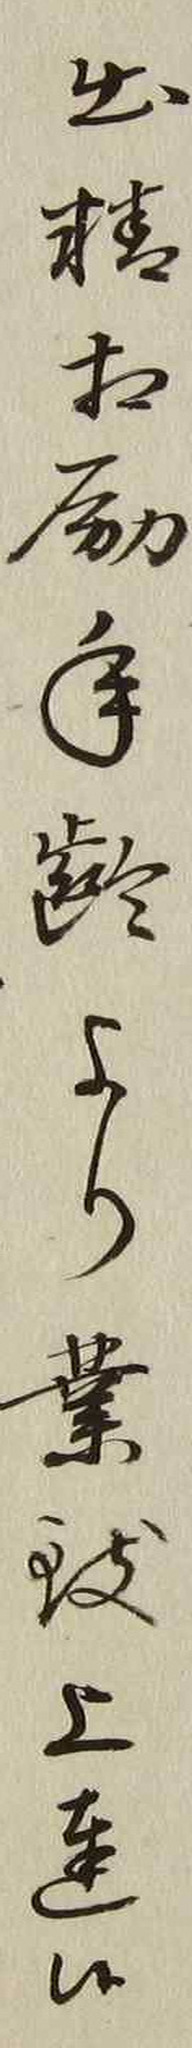出精相励み年齢より業上達致し候
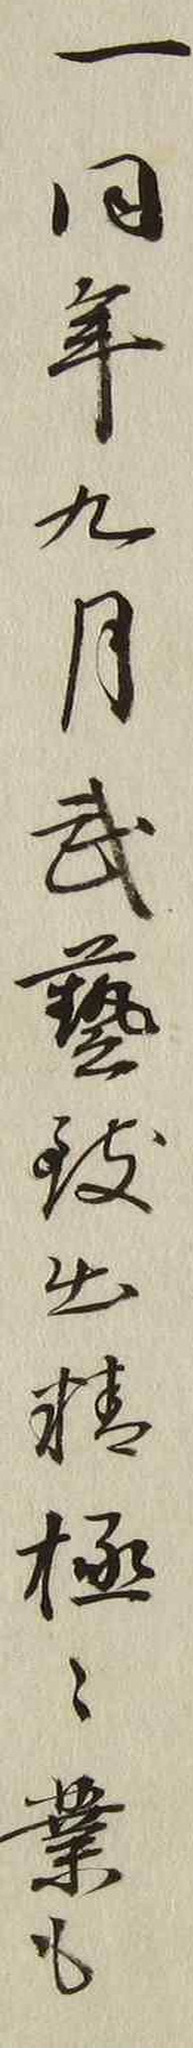一同年九月武芸出精致し極々業も
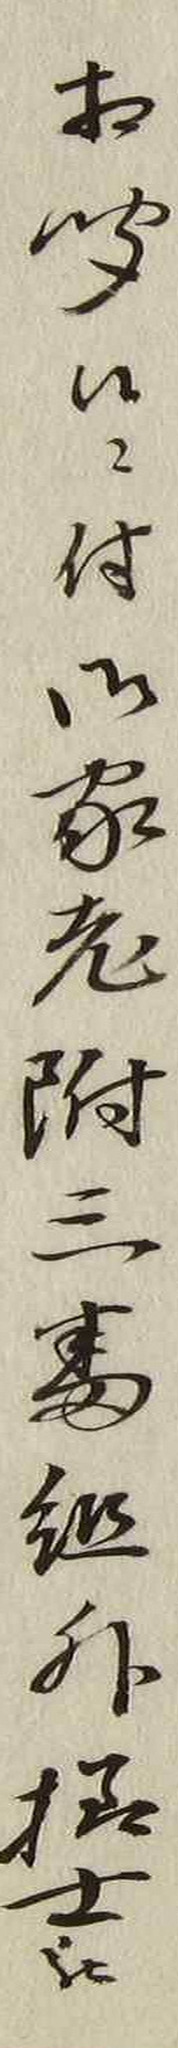相聞け候ニ付御家老附き三番組外様士
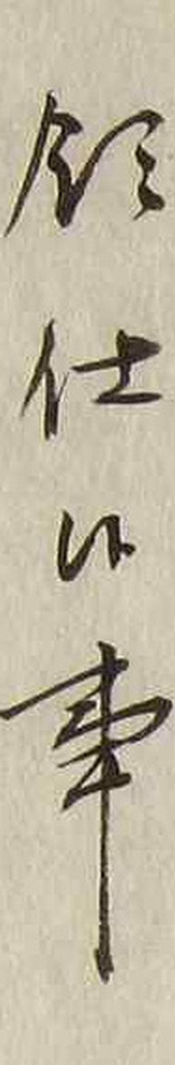領仕候事
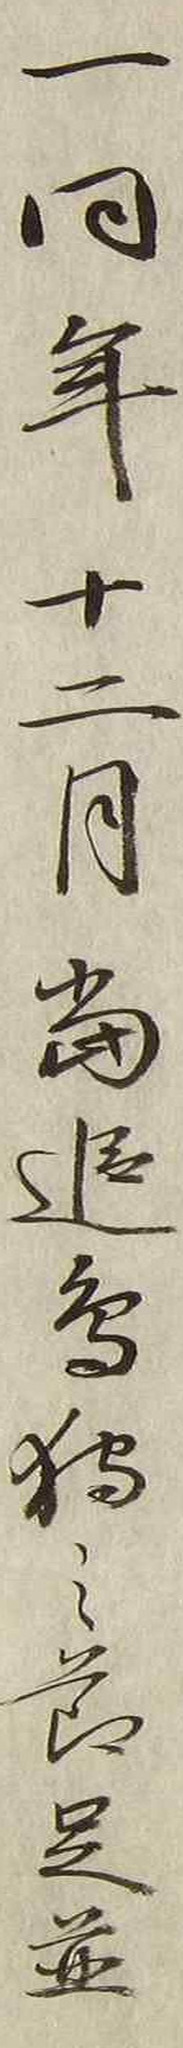一同年十二月当追鳥狩之節足並

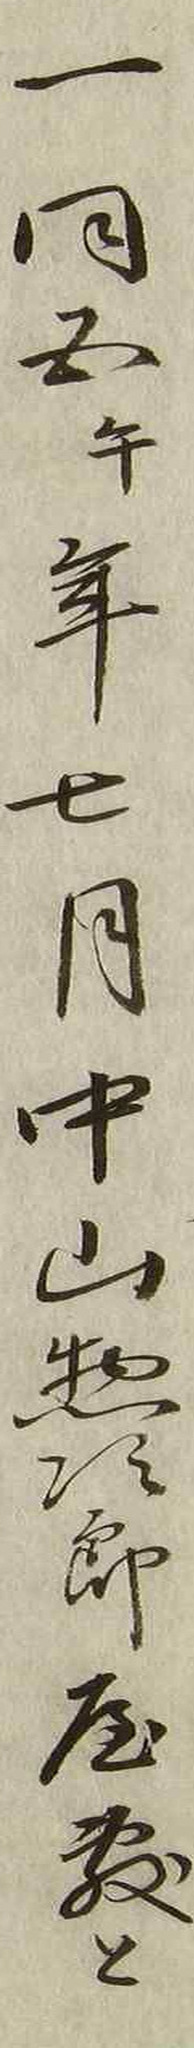一同五午年七月中山惣次郎屋敷と
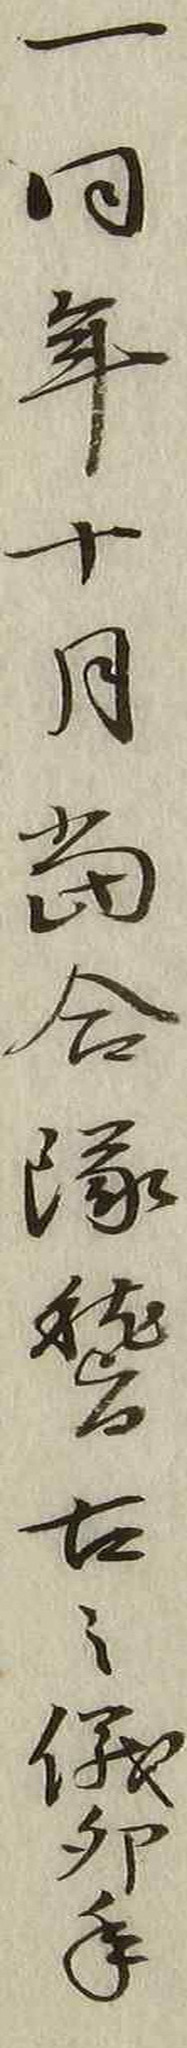一同年十月当合隊稽古之儀卯年
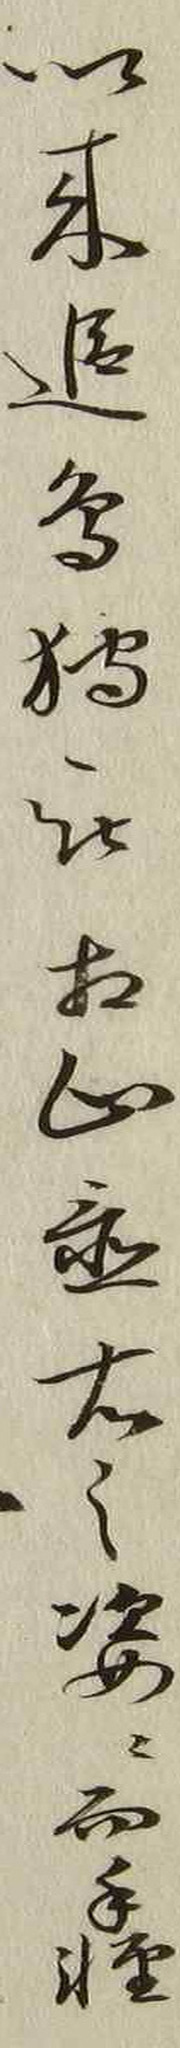以来追鳥狩相止め置かれ右之姿ニて手軽
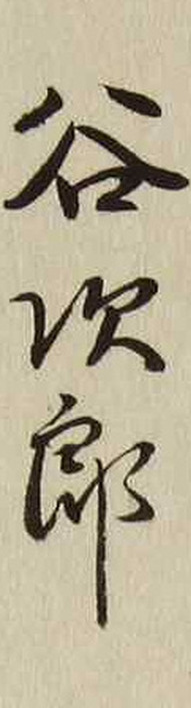谷次郎
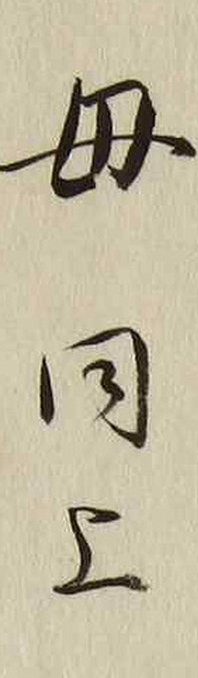母同上
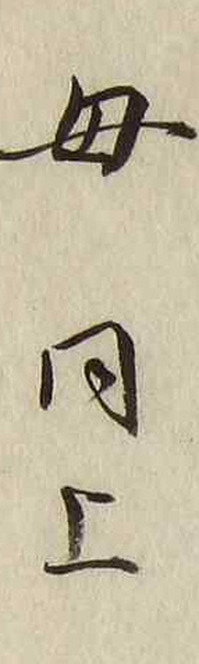母同上

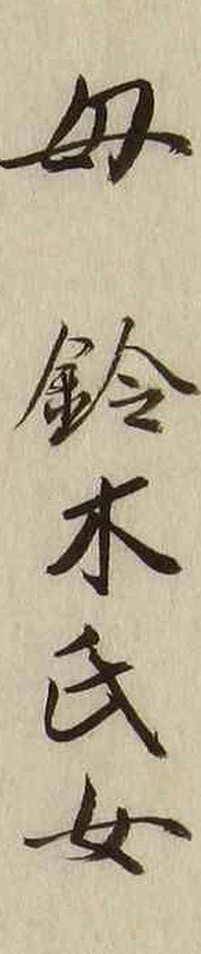母鈴木氏女
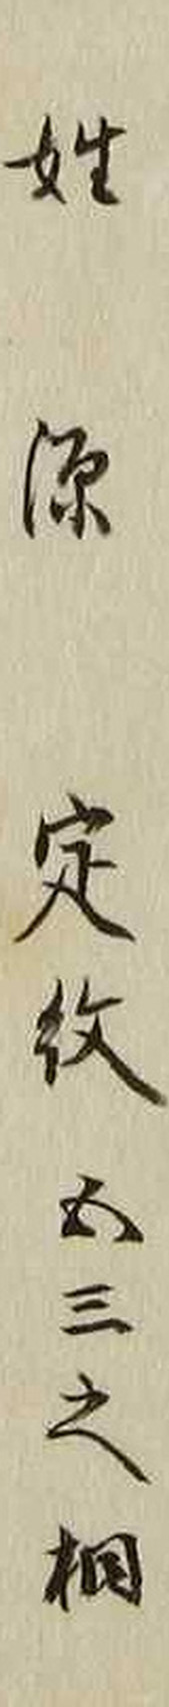姓源定紋五三之桐
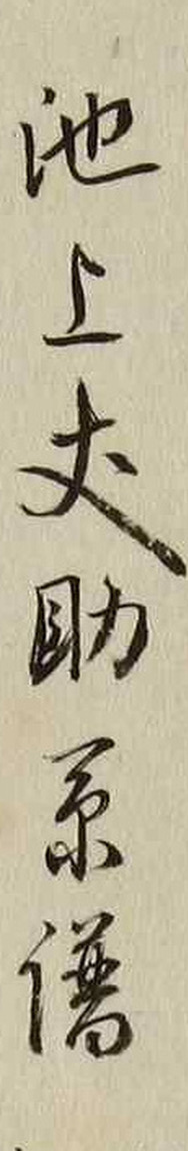池上丈助系譜
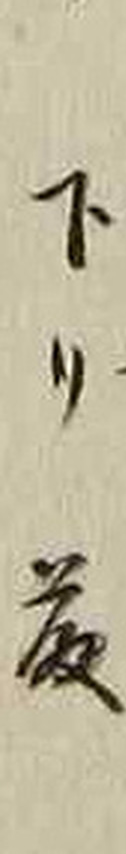下り藤
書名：諸士系譜　巻之19　い之部19
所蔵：会津若松市立会津図書館
